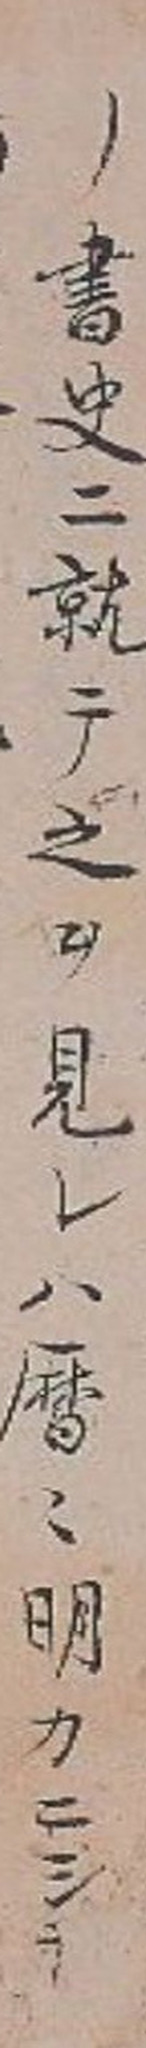ノ書史ニ就テ之ヲ見レハ暦々明カニシテ
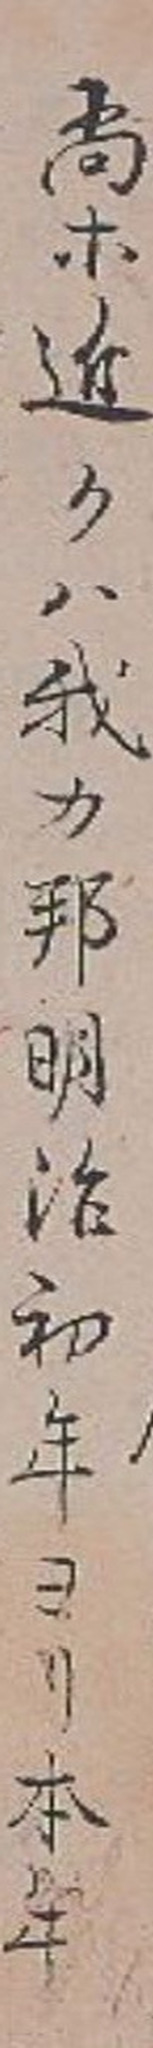尚ホ近クハ我カ邦明治初年ヨリ本年
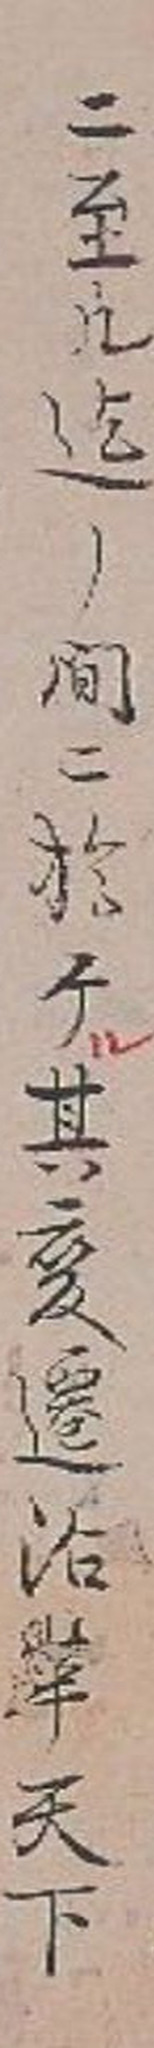ニ至ル迄ノ間ニ於ケル其変遷沿革天下
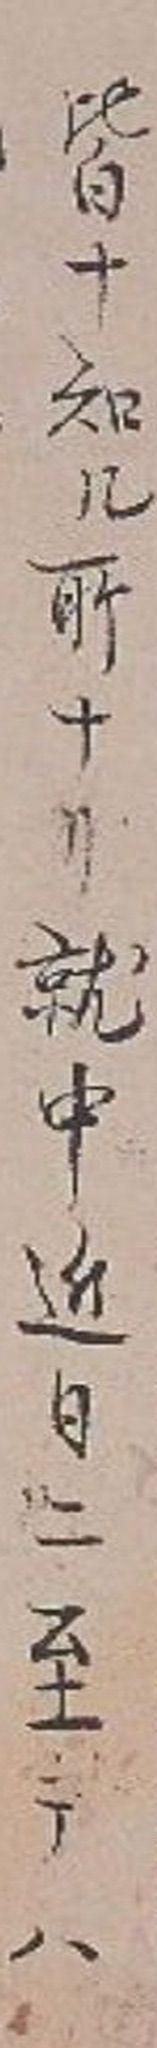皆ナ知ル所ナリ就中近日ニ至テハ
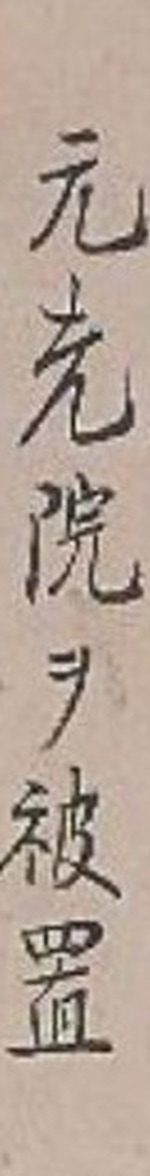元老院ヲ被置
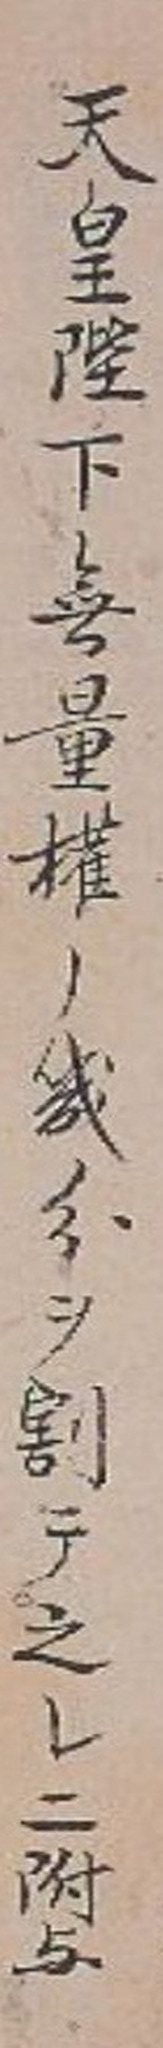天皇陛下無量権ノ幾分ヲ割テ之レニ附与
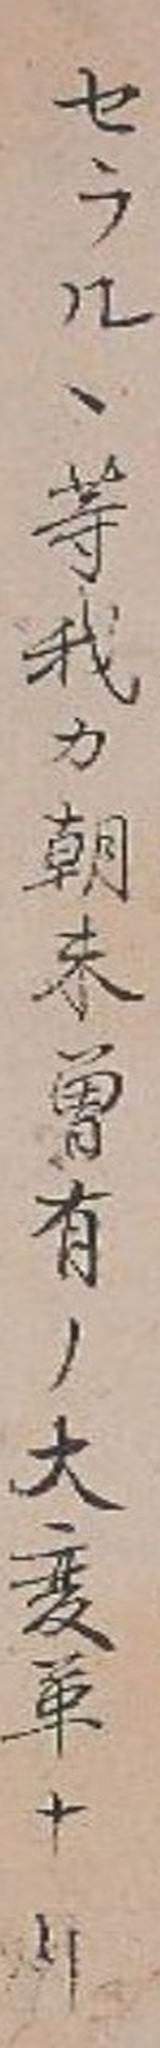セラルヽ等我カ朝未曽有ノ大変革ナリ

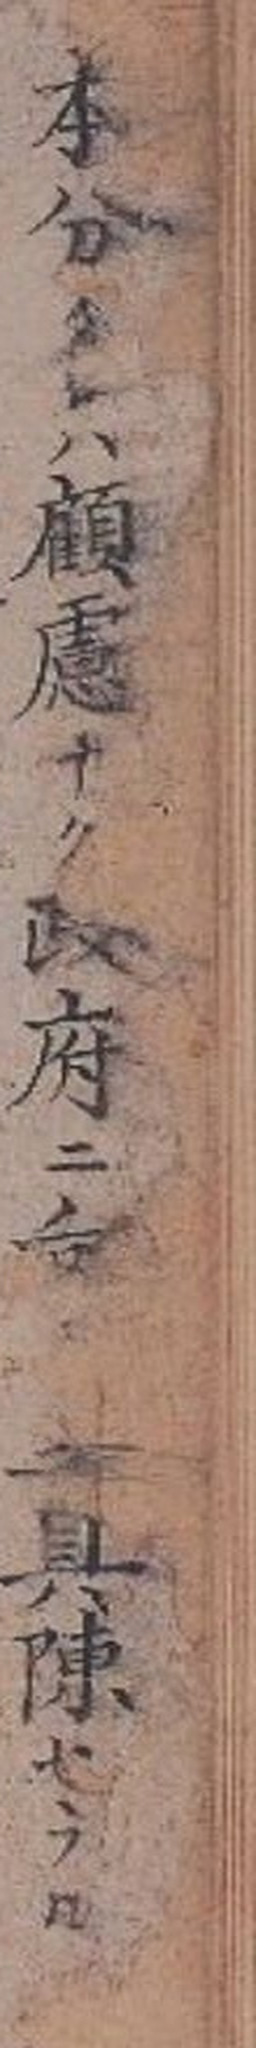本分タレハ顧慮ナク政府ニ具陳セラル
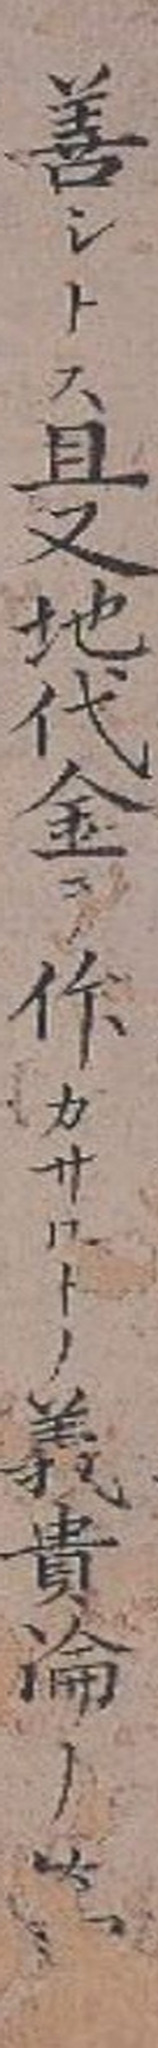善シトス且又地代金ヲ仰カサルトノ義貴論ノ
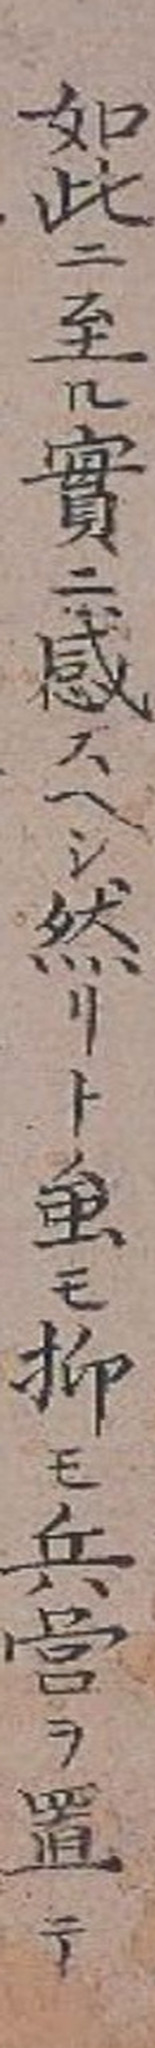如此ニ至ル実ニ感ズヘシ然リト雖モ抑モ兵営ヲ置テ
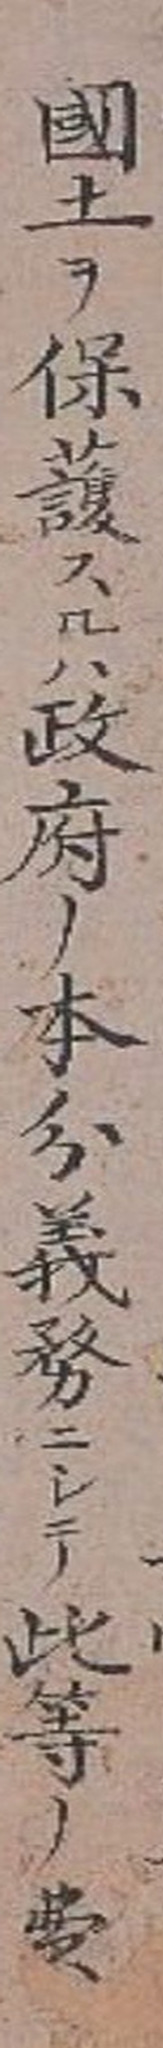国土ヲ保護スルハ政府ノ本分義務ニシテ此等ノ費
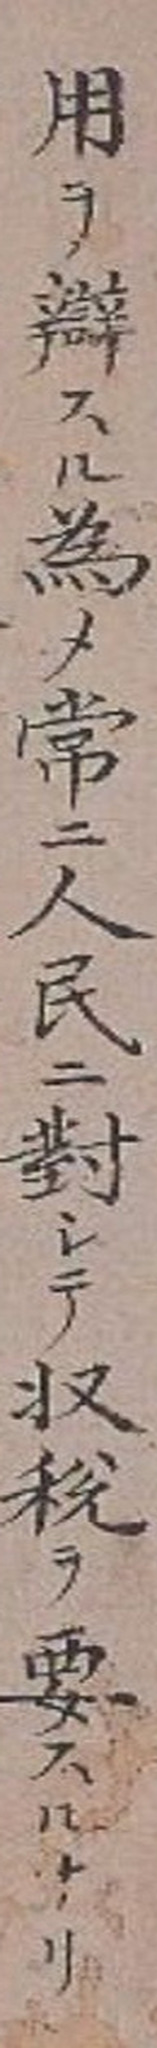用ヲ弁スル為メ常ニ人民ニ対シテ収税ヲ要スルナリ
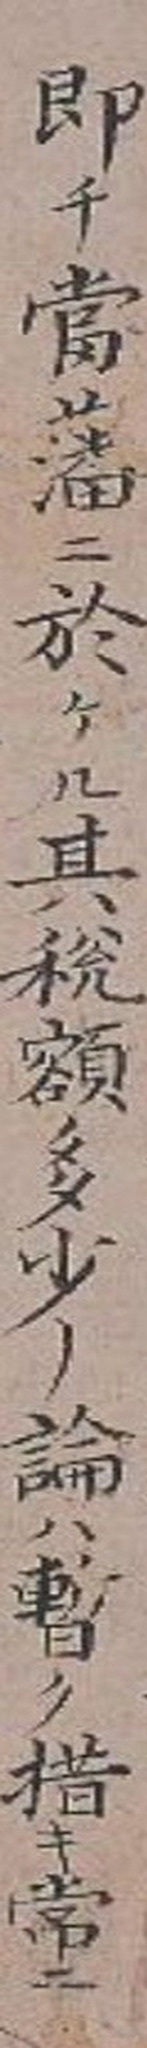即チ当藩ニ於ケル其税額多少ノ論ハ暫ク措キ常ニ
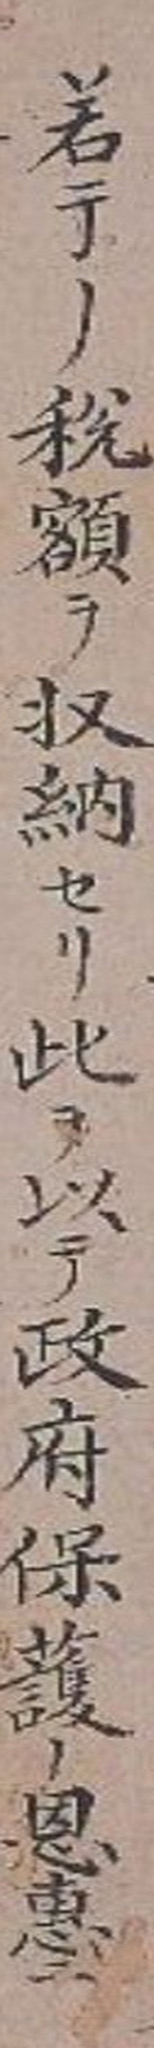若干ノ税額ヲ収納セリ此ヲ以テ政府保護ノ恩恵ニ
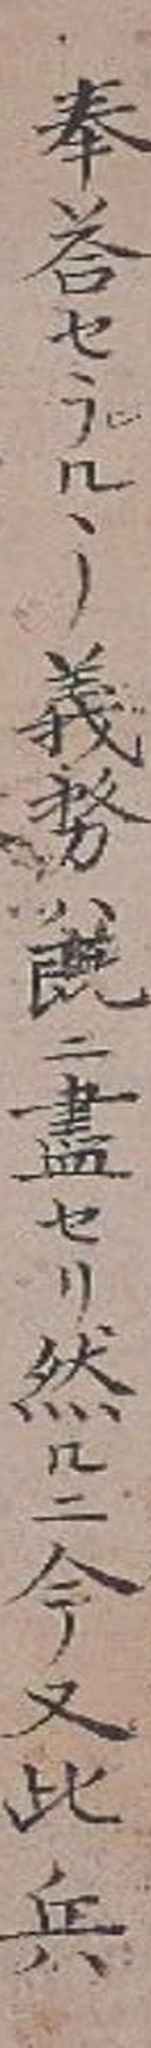奉答セラルヽノ義務ハ既ニ尽セリ然ルニ今又此兵
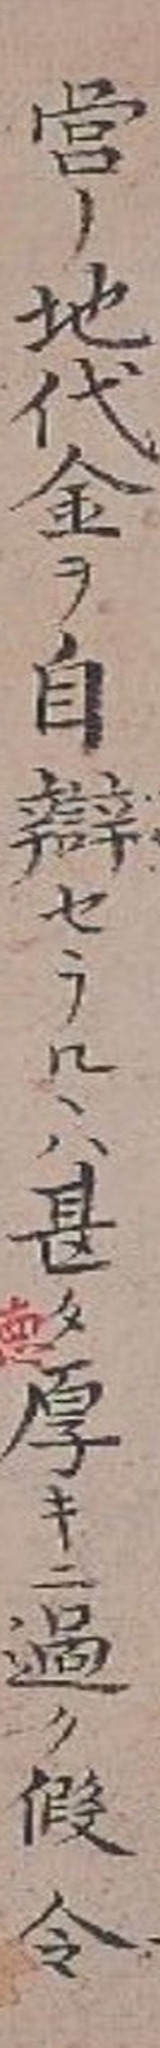営ノ地代金ヲ自弁セラルヽハ甚タ厚キニ過ク仮令
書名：奉使琉球始末 草稿之一部
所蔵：University of the Ryukyus Library
